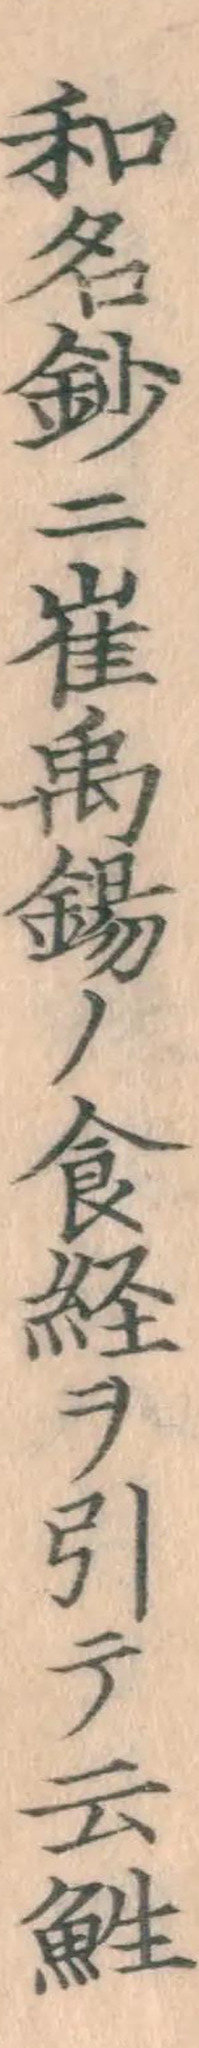和名鈔ニ崔禹錫ノ食経ヲ引テ云鮏
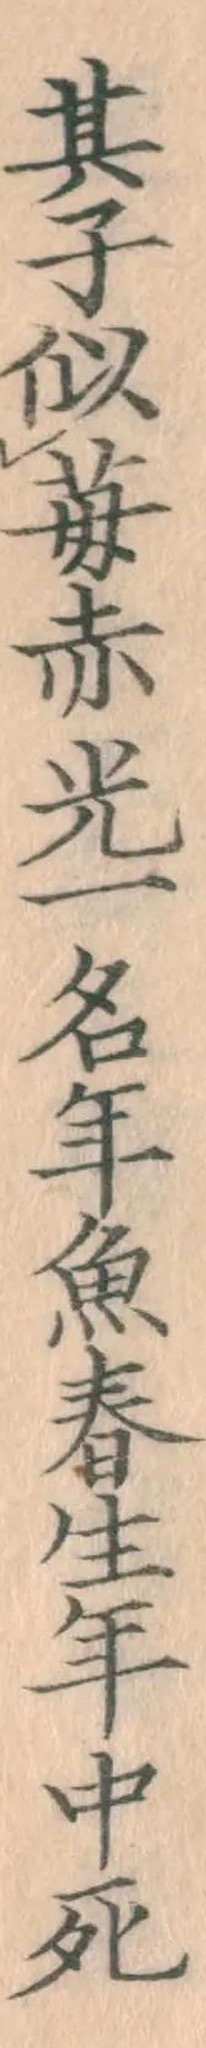其子似苺赤光一名年魚春生年中死
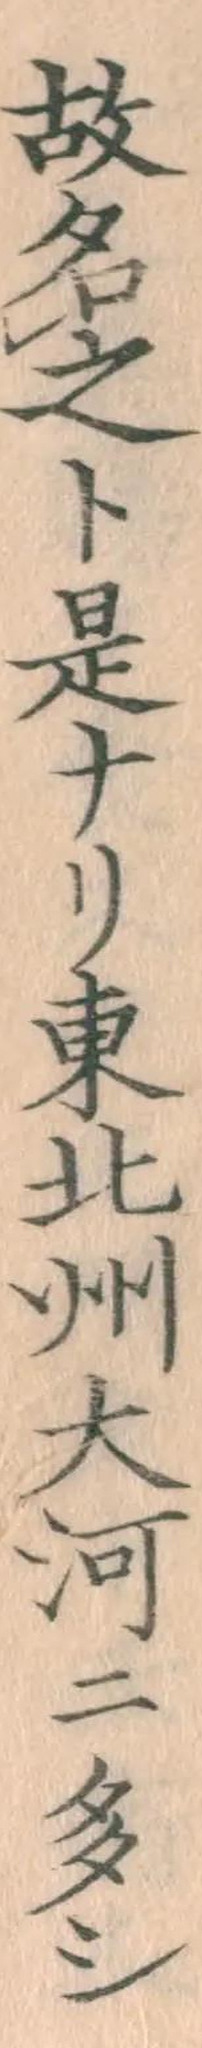故名之ト是ナリ東北州大河ニ多シ
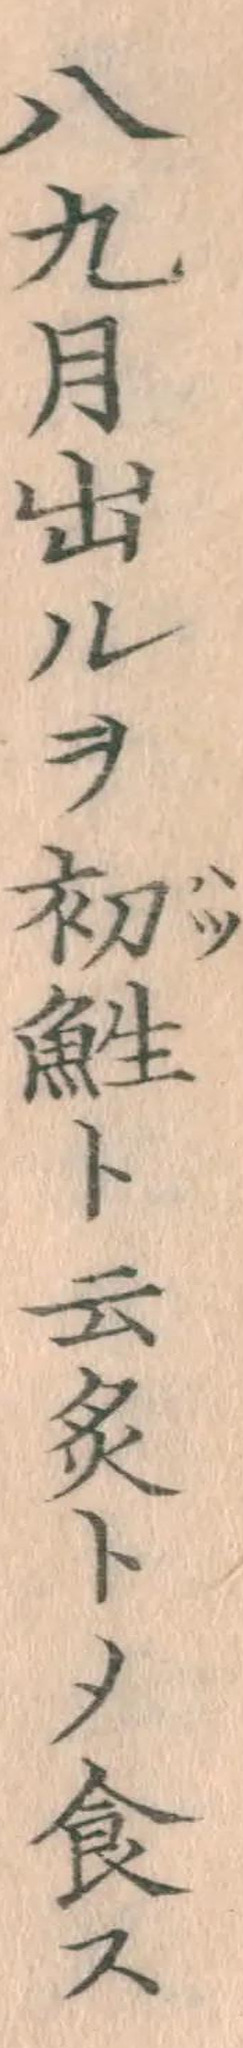八九月出ルヲ初鮏ト云炙トシテ食ス
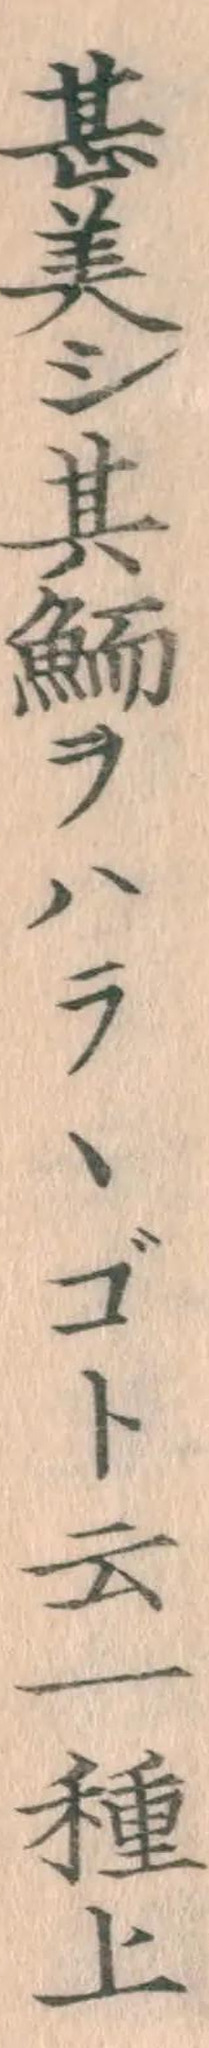甚美シ其鮞ヲハラヽゴト云一種上
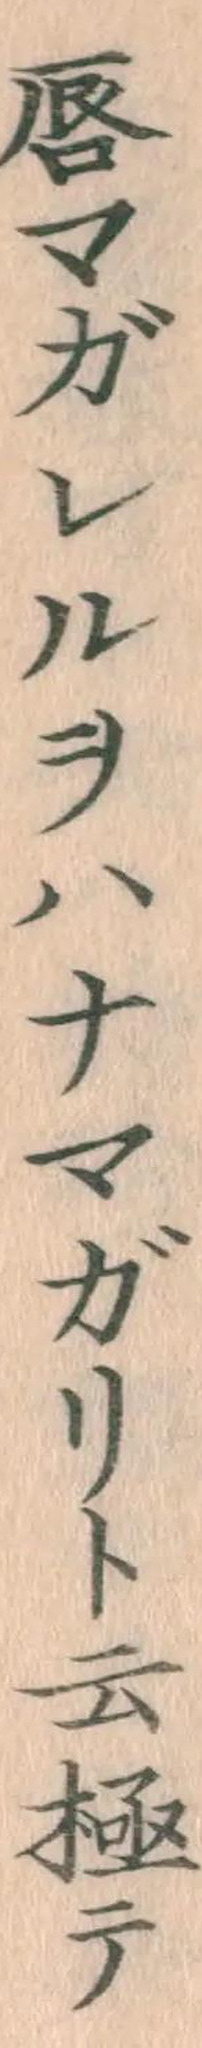唇マガレルヲハナマガリト云極テ
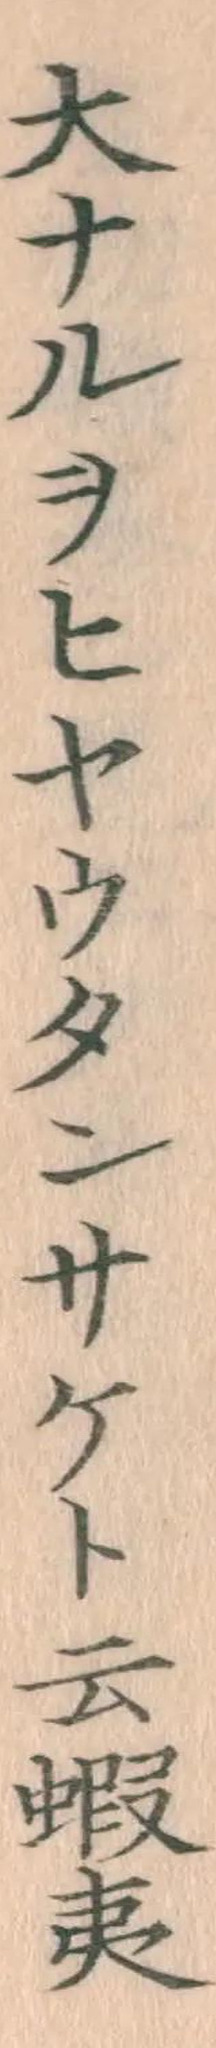大ナルヲヒヤウタンサケト云蝦夷
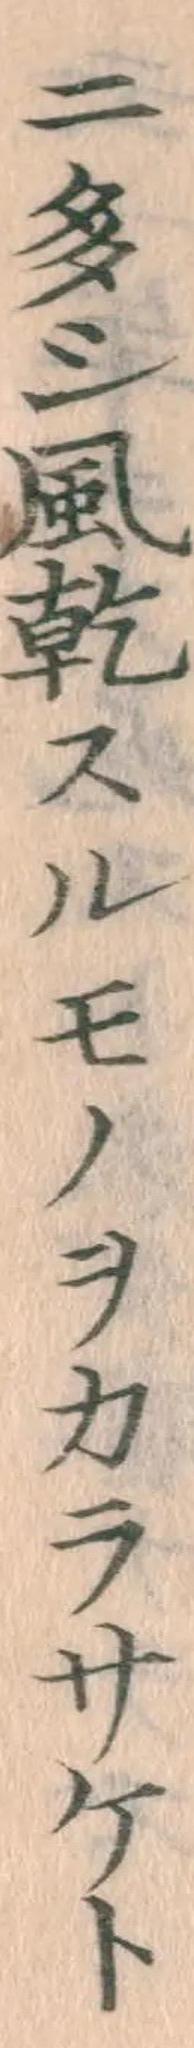ニ多シ風乾スルモノヲカラサケト
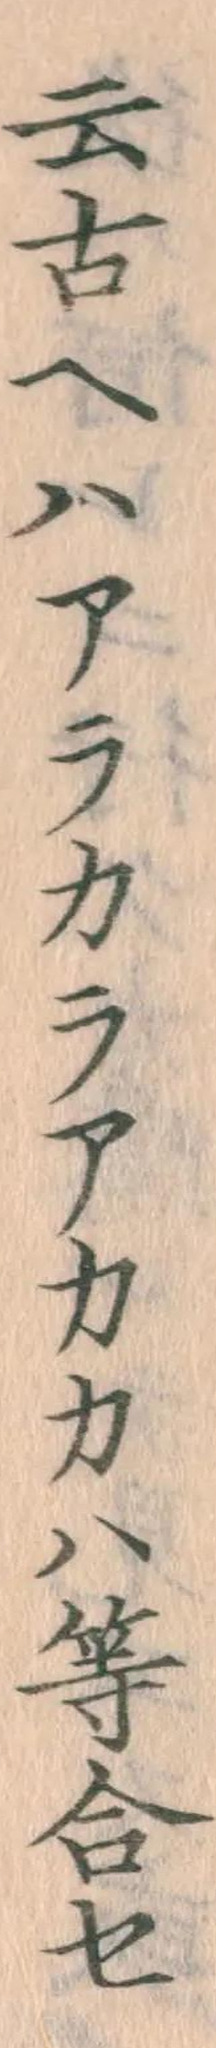云古ヘハアラカラアカカハ等合セ
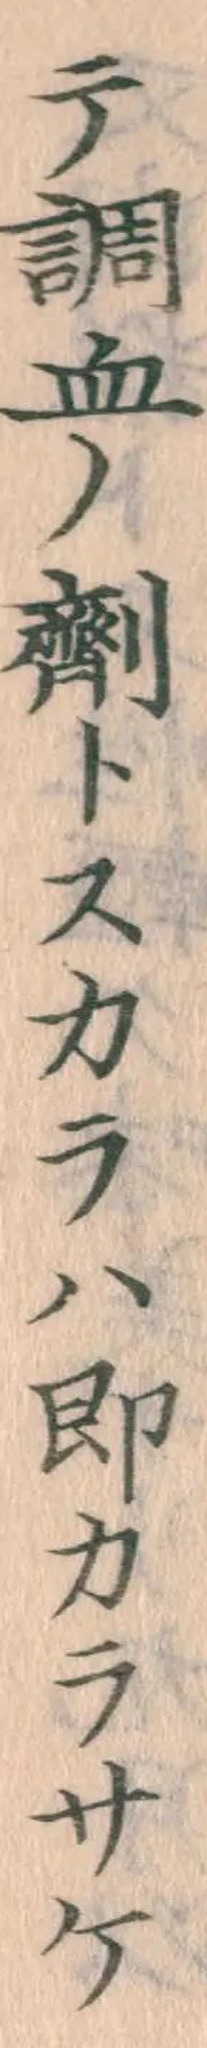テ調血ノ剤トスカラハ即カラサケ
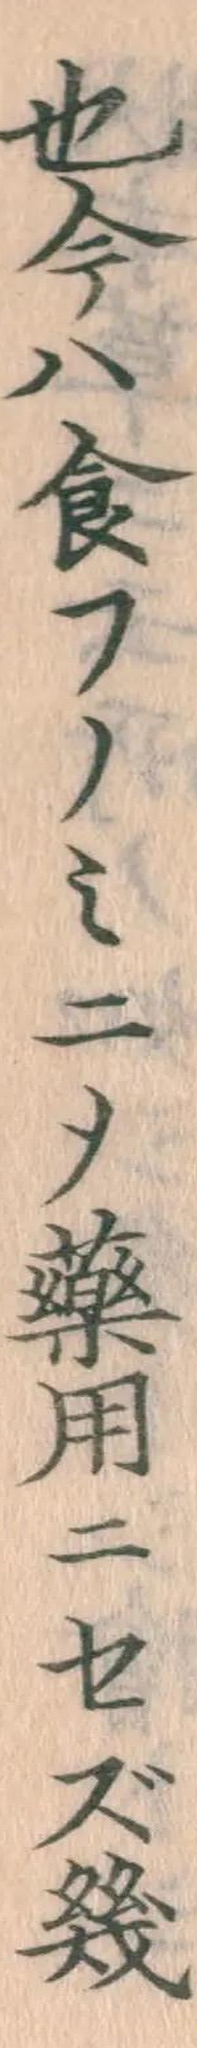也今ハ食フノミニシテ薬用ニセズ幾
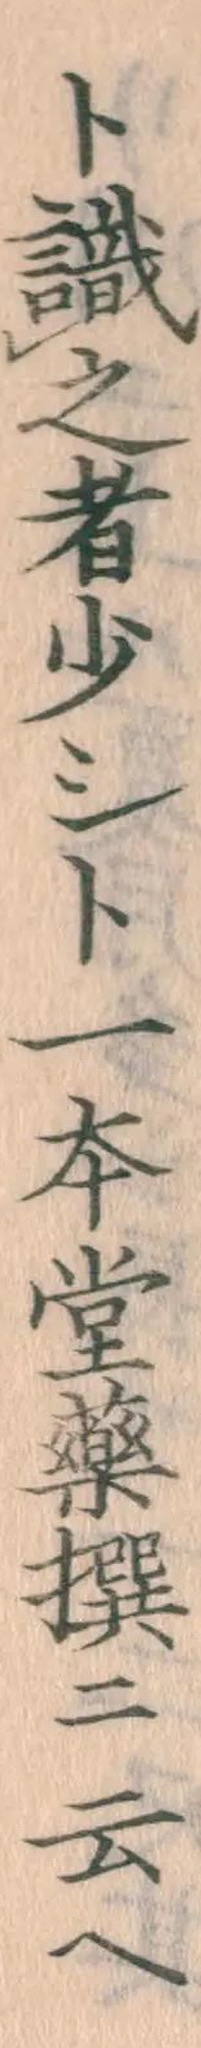ト識之者少シト一本堂薬撰ニ云ヘ
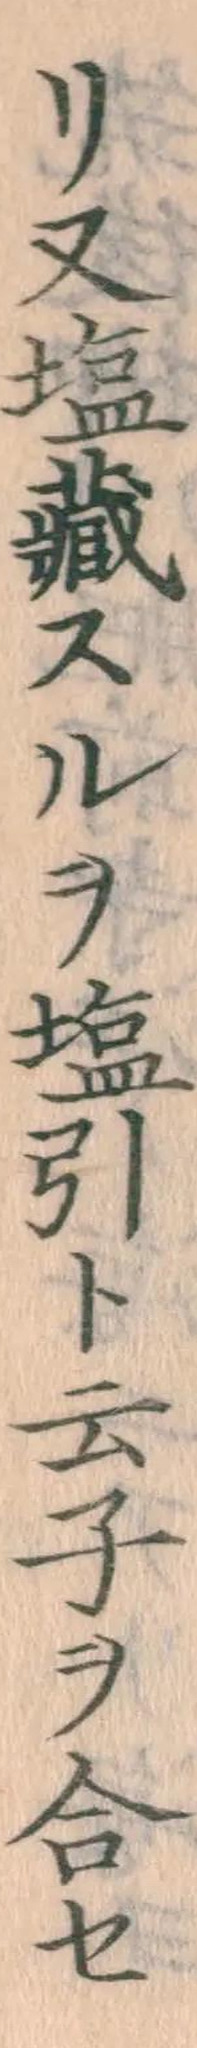リ又塩蔵スルヲ塩引ト云子ヲ合セ
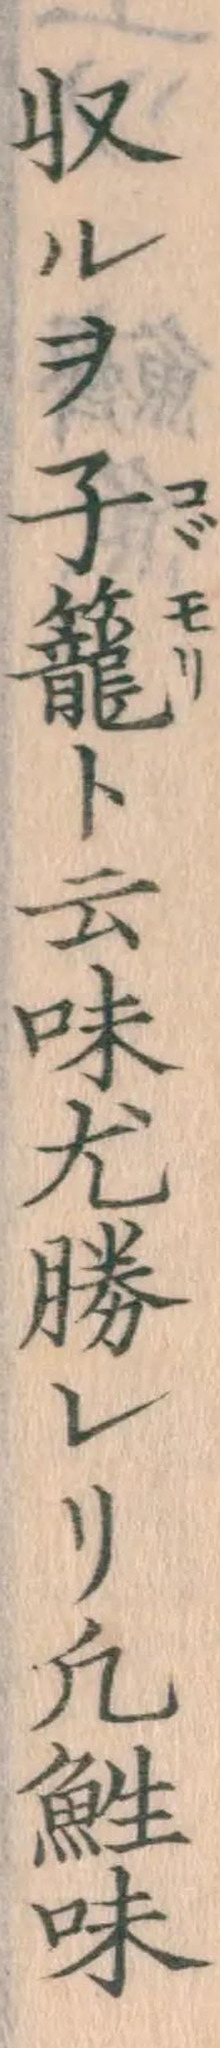収ルヲ子籠ト云味尤勝レリ凡鮏味
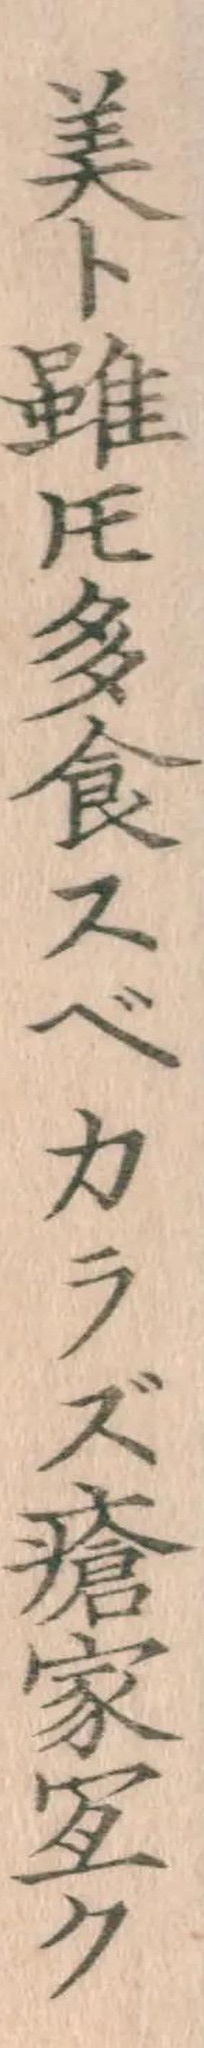美ト雖トモ多食スベカラズ瘡家宜ク
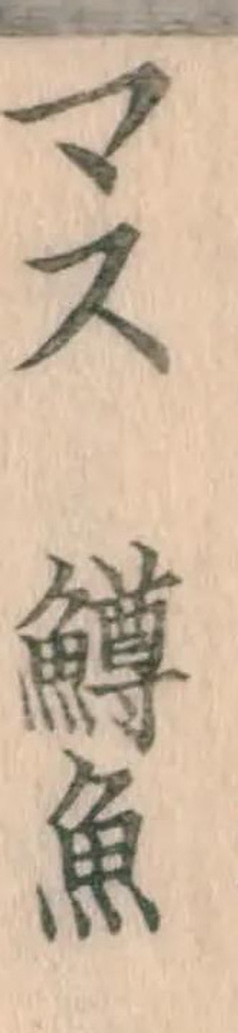マス鱒魚
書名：皇和魚譜 2巻
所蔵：国立国会図書館 National Diet Library, JAPAN
